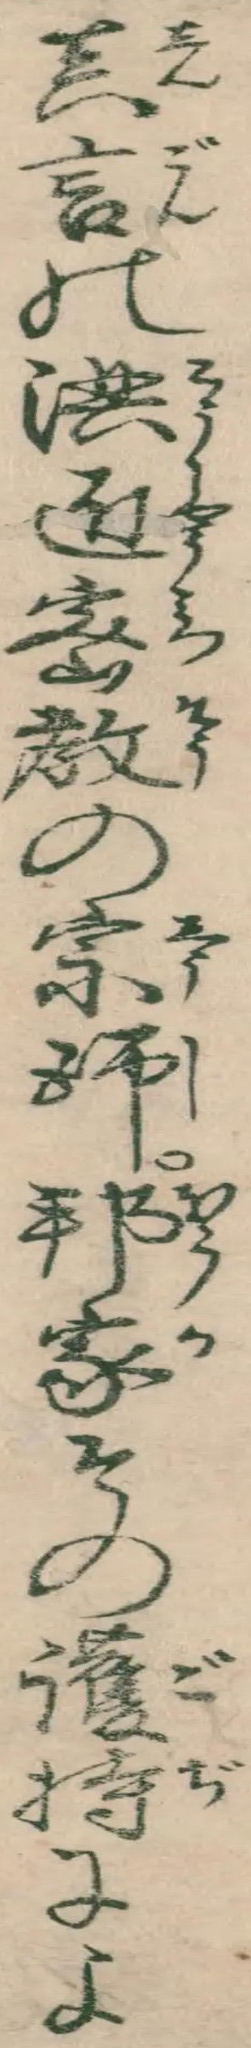真言の洪匠密教の宗師。邦家その護持により。
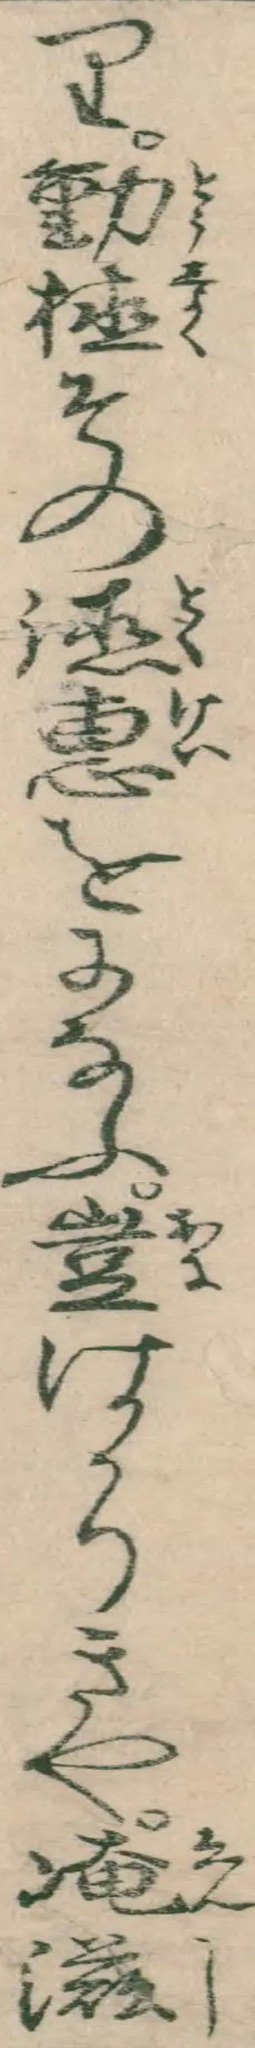動植その徳恵をになふ。豈はかりきや。淹滋
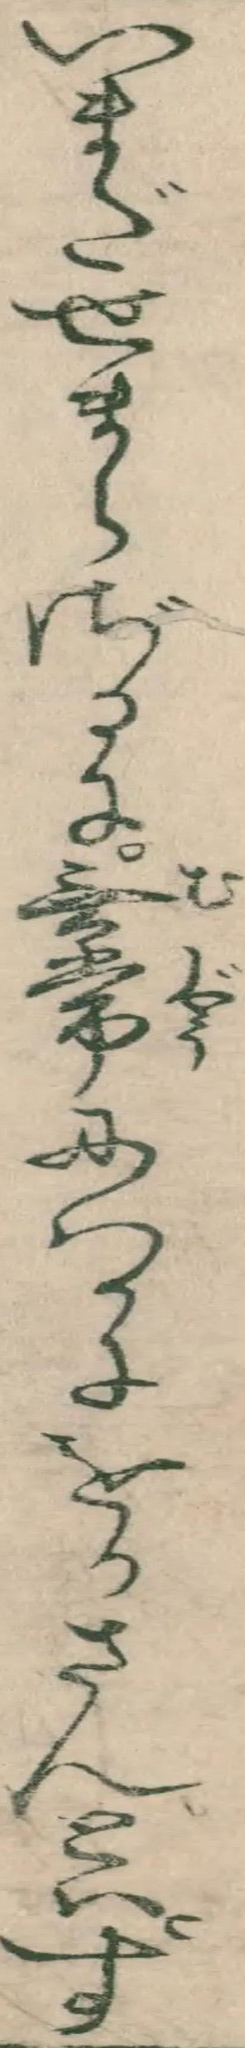いまだせまらざるに。無常にはかにをかさんとは。す
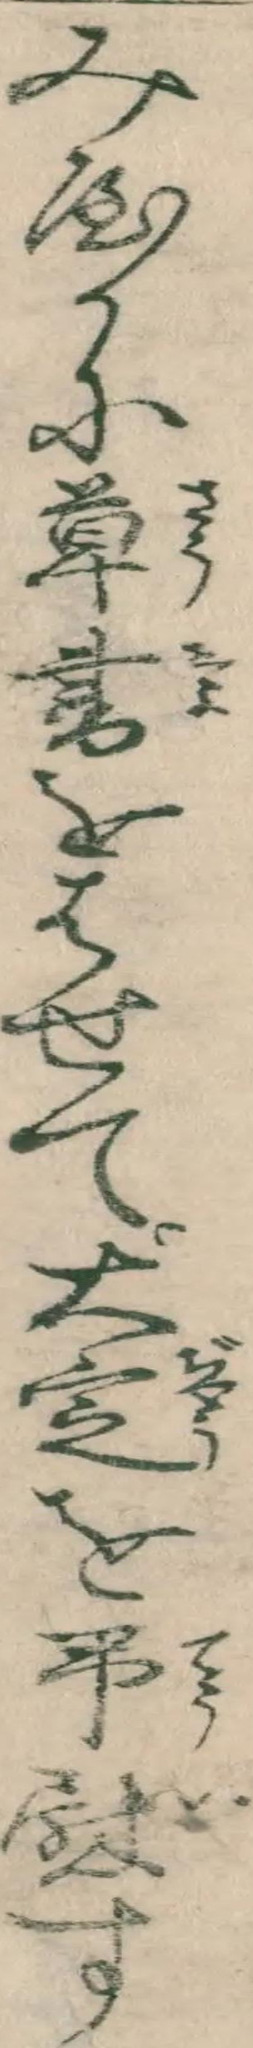みやかに草書をはせて。大定を弔慰す
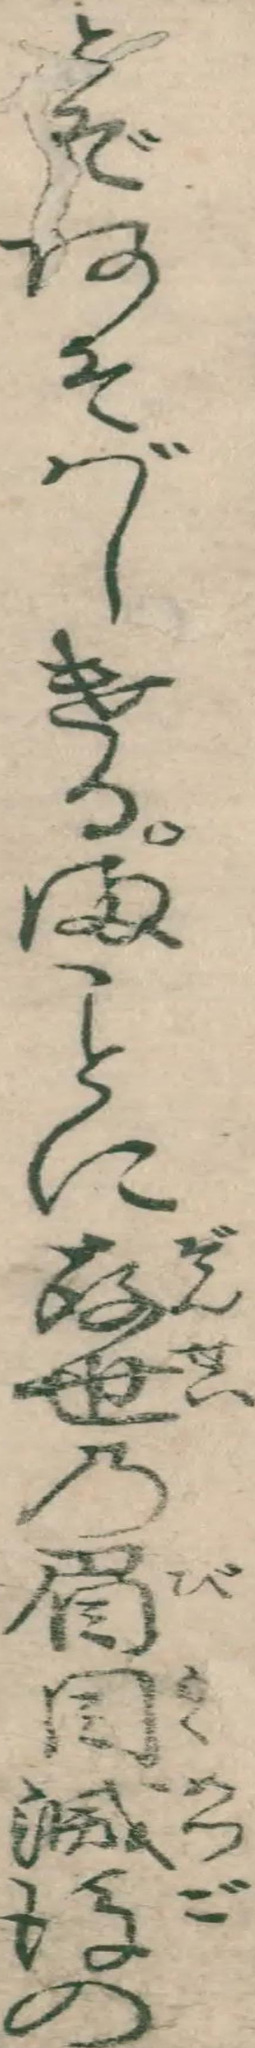とぞあそばしける。まことに存世の眉目滅後の
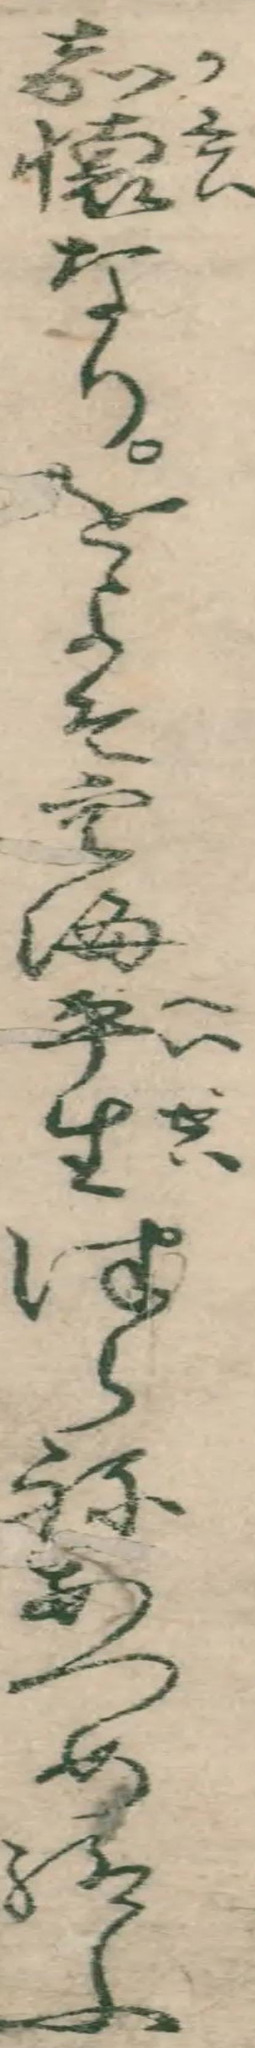嘉懐なり。をよそ空海平生つらねあつめ給ふ

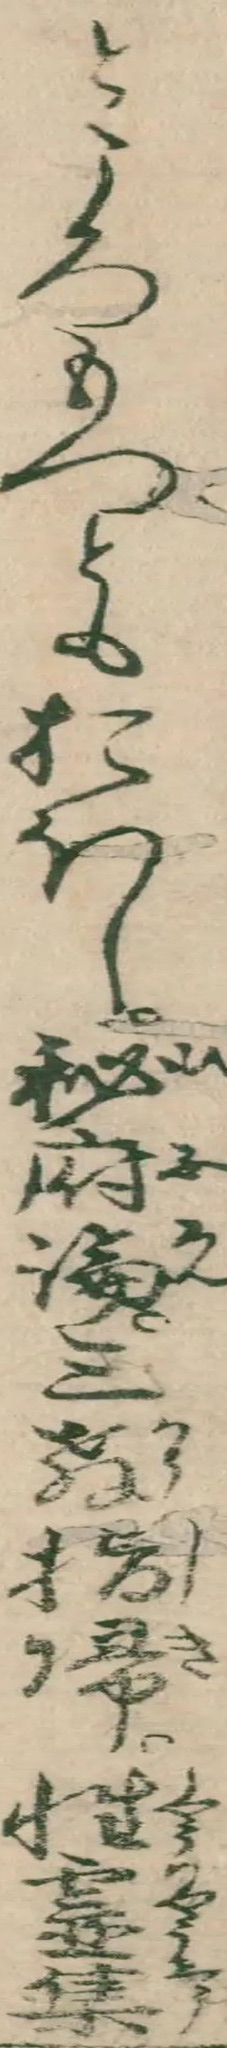ところもつともおほし。秘府論。三教指帰。性霊集
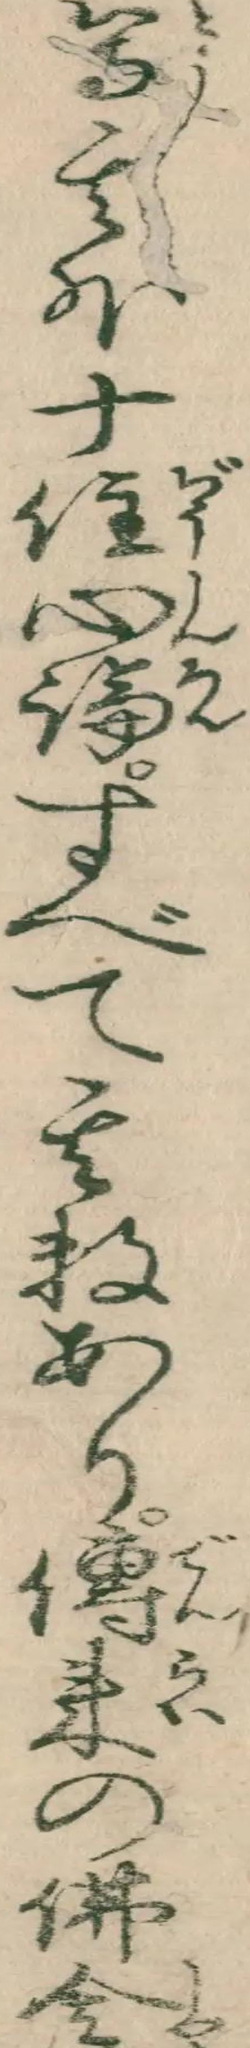等其外十住心論。すべて其教あり。伝来の仏舎
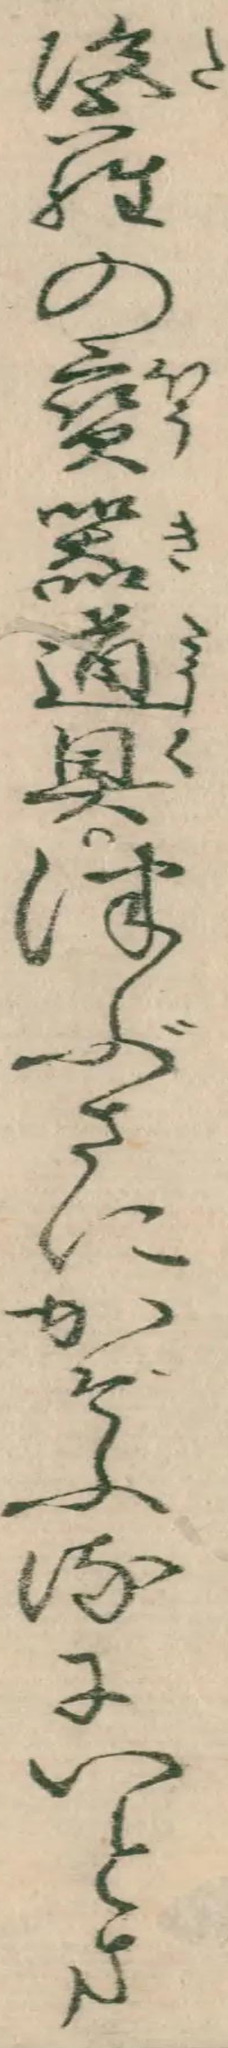陀羅の宝器道具。つぶさにかぞふるにいとま
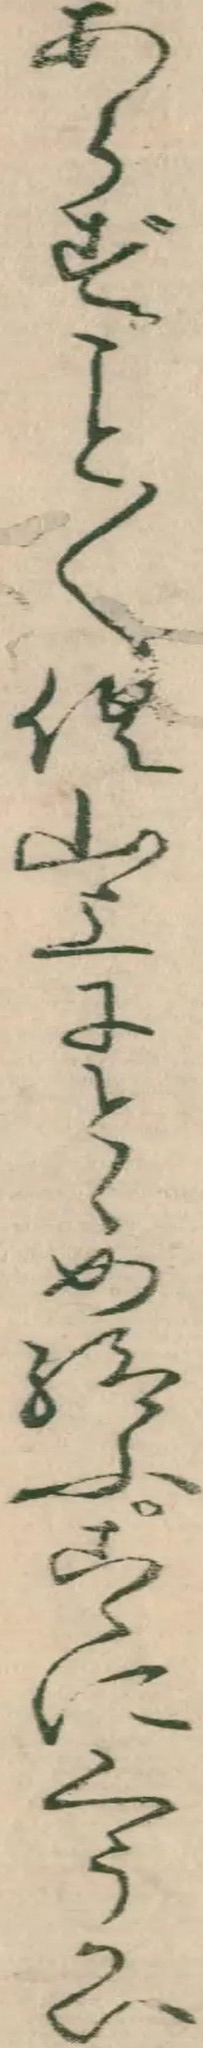あらずこと〴〵く山上にとゝめ給ふ。こゝにくうかい
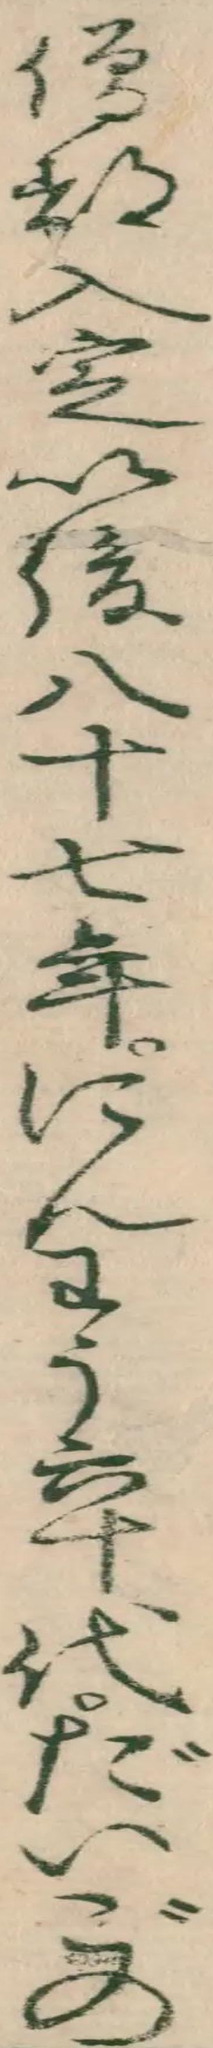僧都入定以後八十七年。にんわう六十代。だいごの
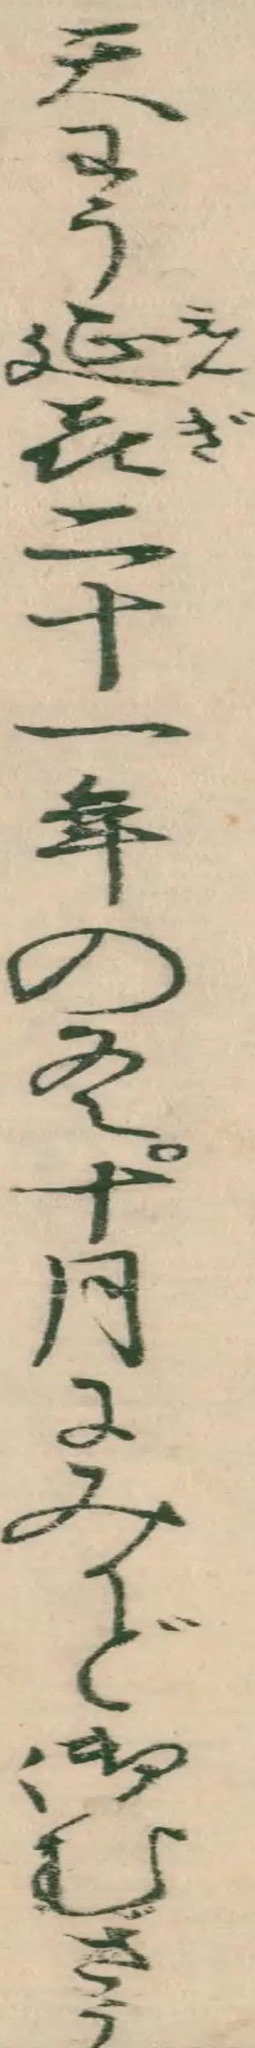天わう延喜二十一年の冬。十月にみかど御むさう
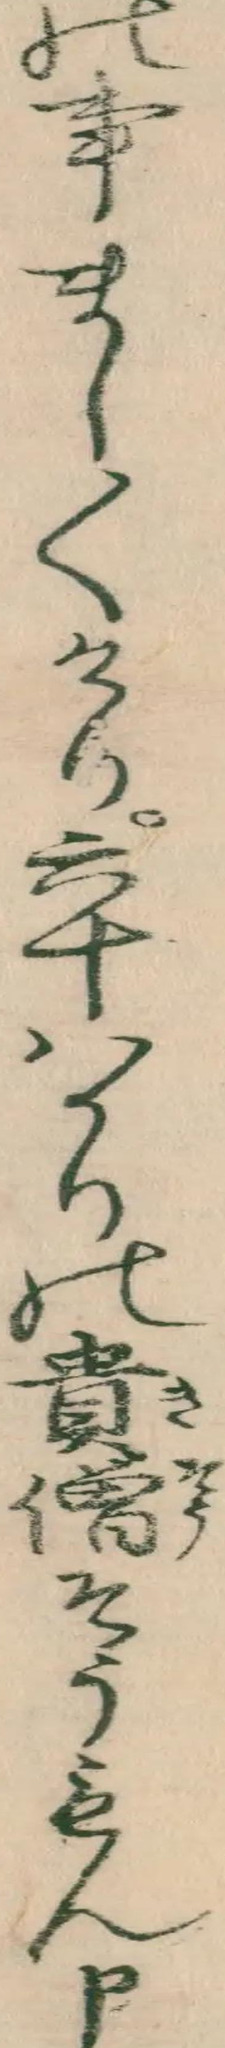の事まし〳〵けり。六十はかりの貴僧そうもん申
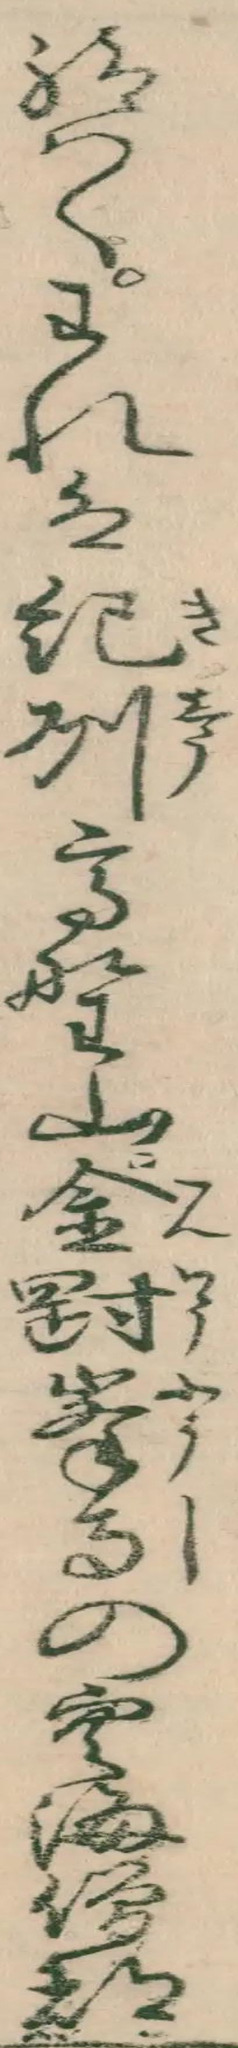給はく。われは紀州高野山。金剛峯寺の空海僧都
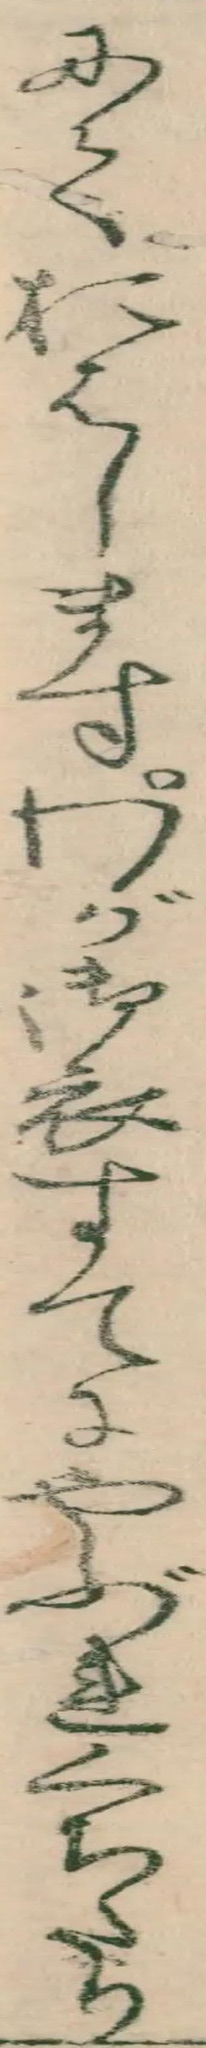にておはします。わが御衣すてにやぶれくちたり
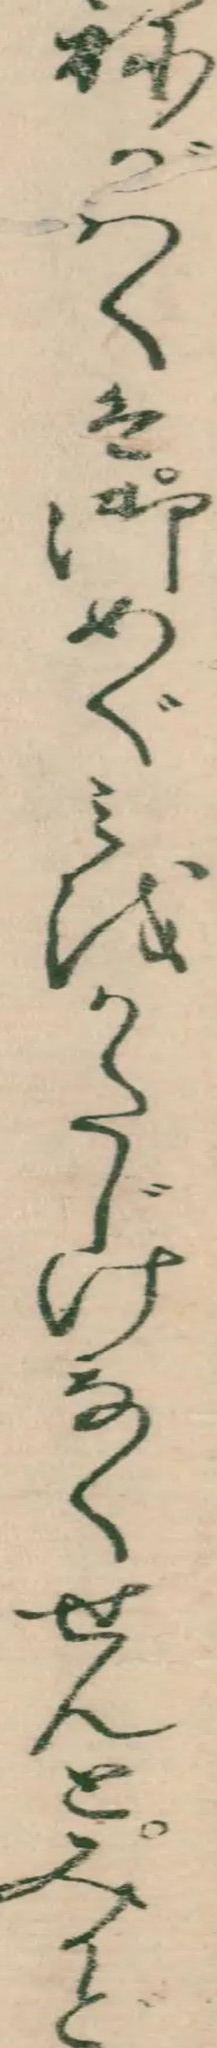ねがはくは。御めぐみをかたじけなくせんと。みかど
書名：弘法大師御本地 3巻. [3]
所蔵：国立国会図書館 National Diet Library, JAPAN
